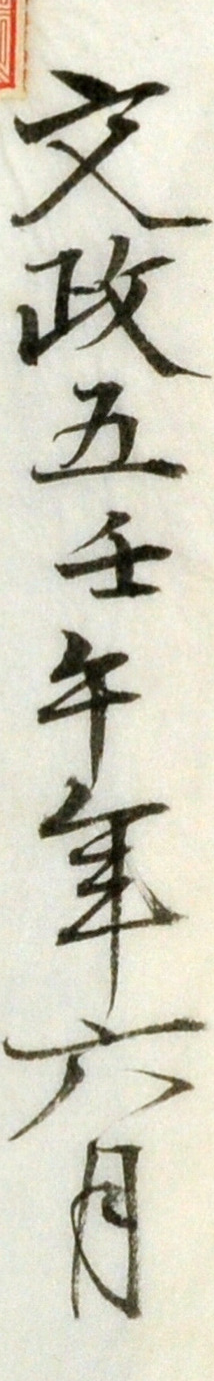文政五壬午年六月
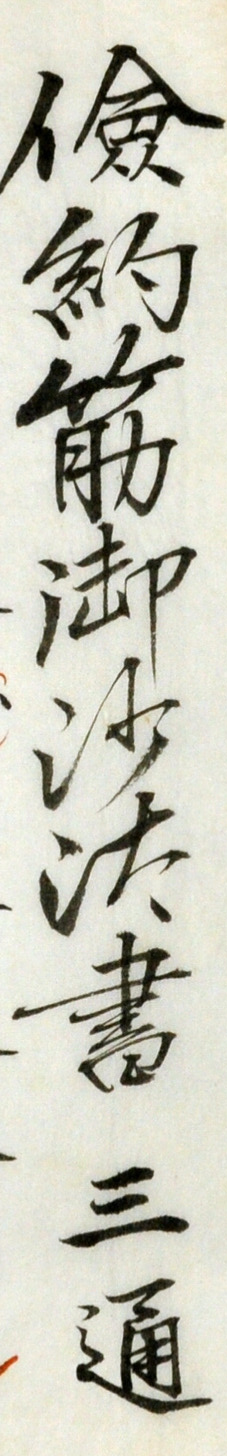倹約筋御沙汰書三通
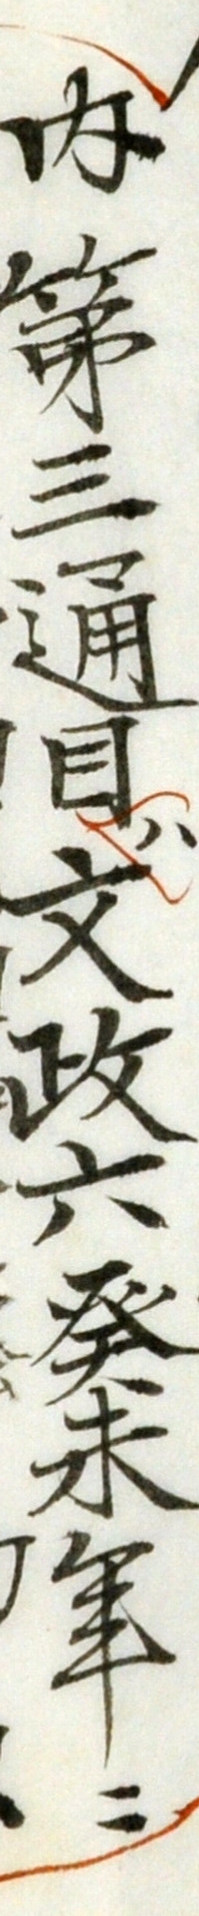内第三通目ハ文政六癸未年ニ
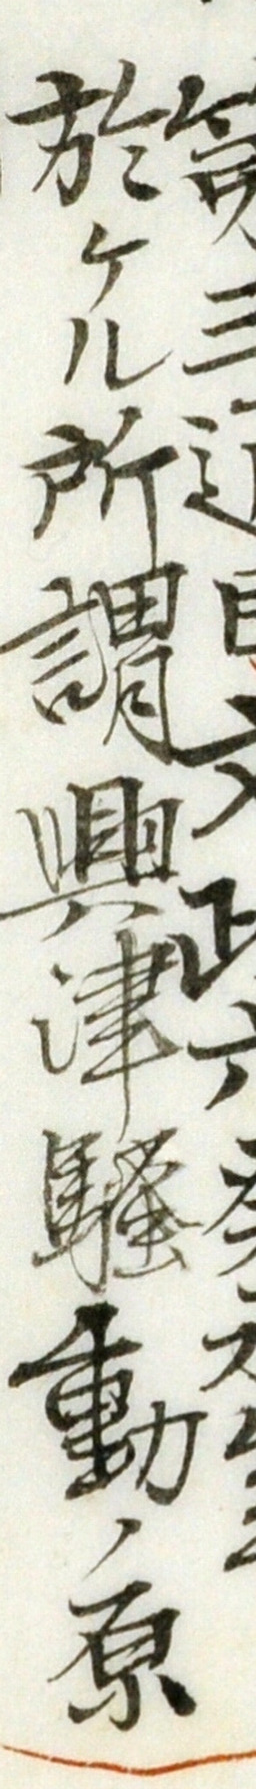於ケル所謂興津騒動ノ原
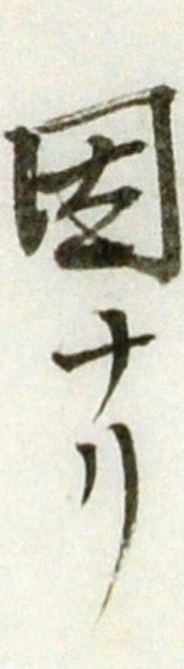因ナリ

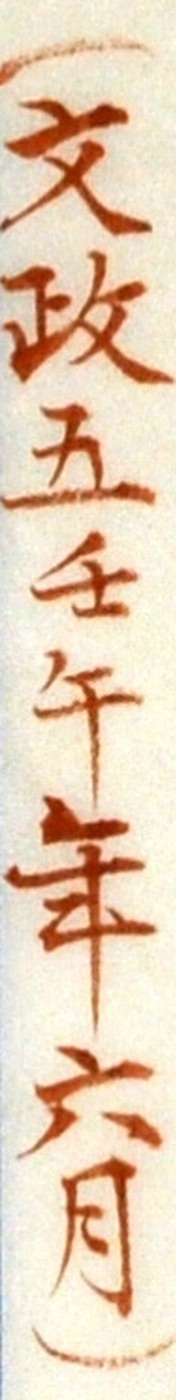(文政五壬午年六月)
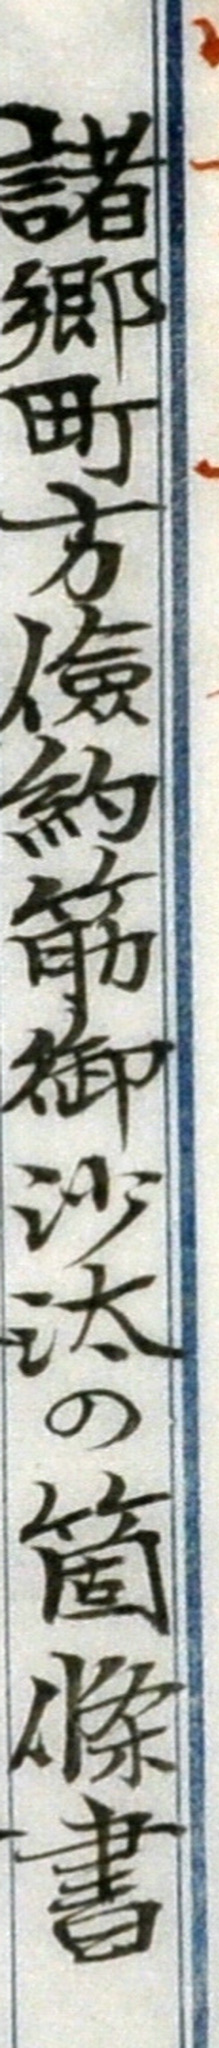諸郷町方倹約筋御沙汰の箇条書
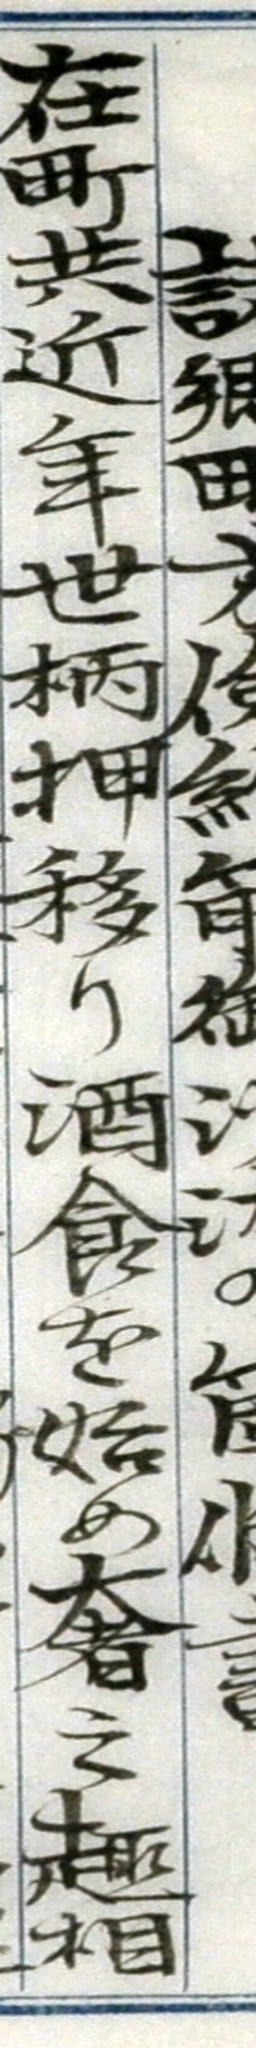在町共近年世柄押移り酒食を始め奢之趣相
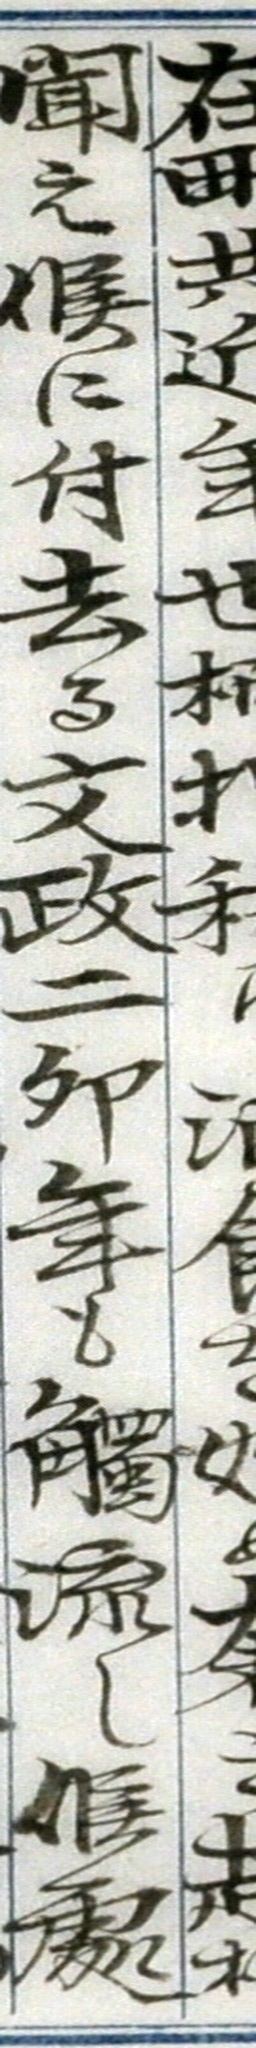聞え候に付去る文政二卯年も触流し候処
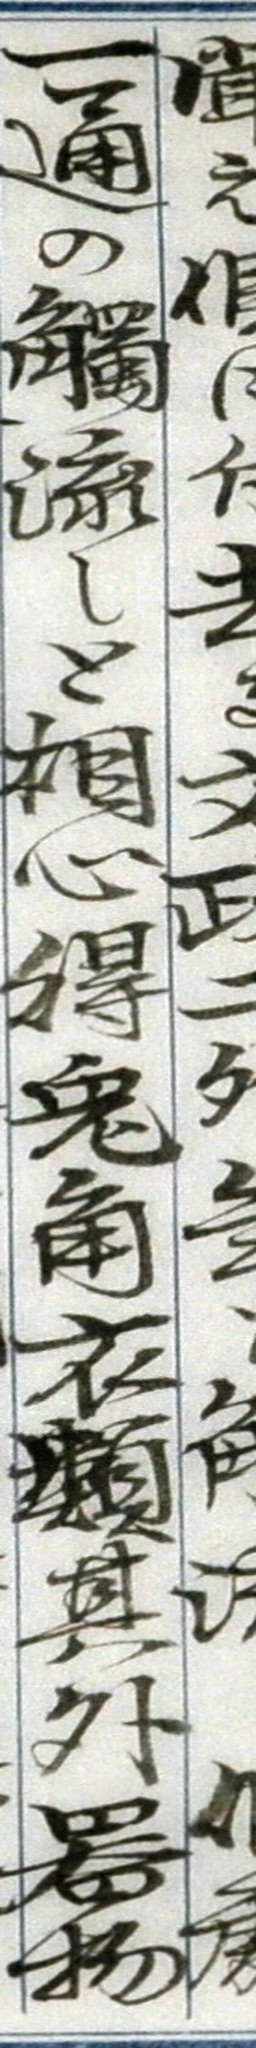一通の触流しと相心得兎角衣類其外器物
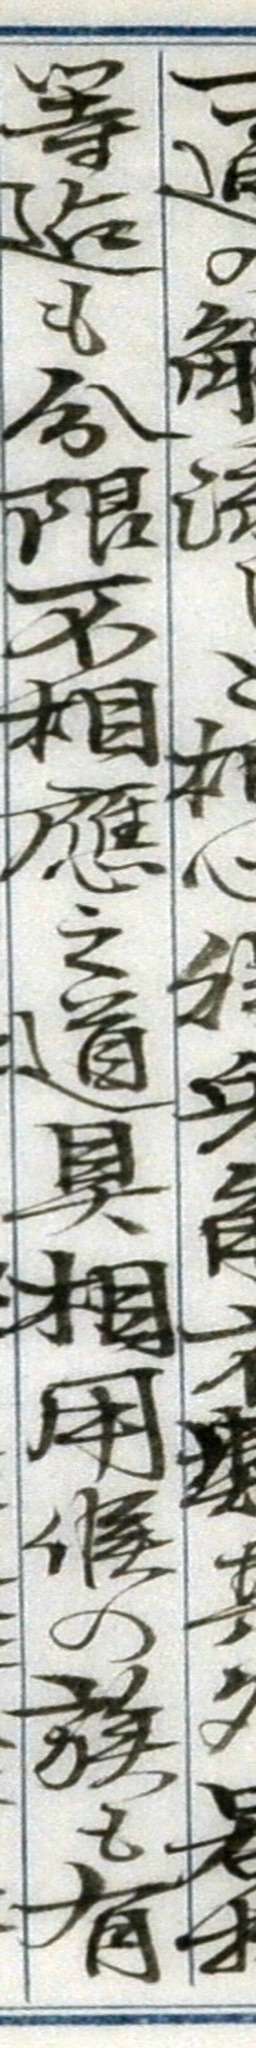等迄も分限不相応之道具相用候の族も有
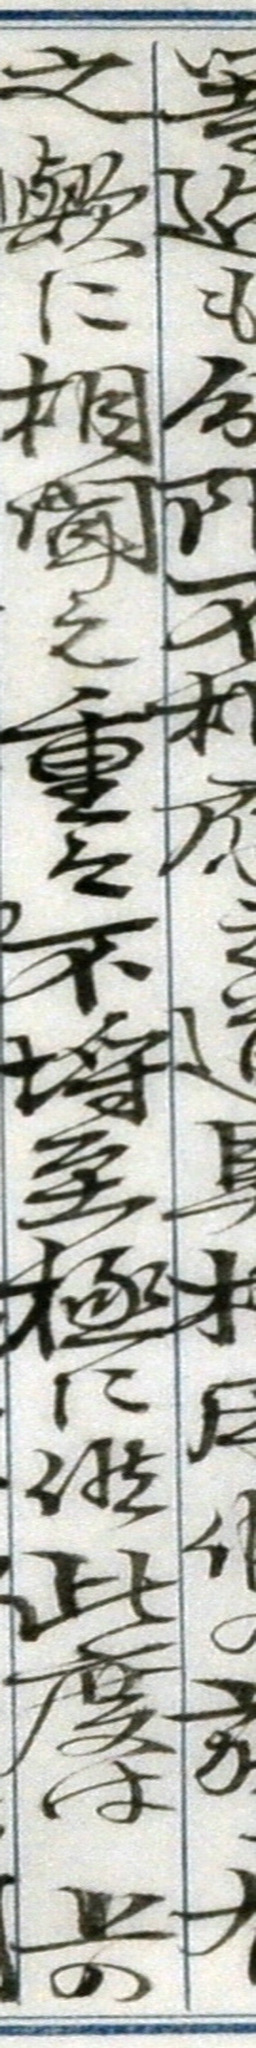之歟に相聞え重々不埒至極に候此度は上の
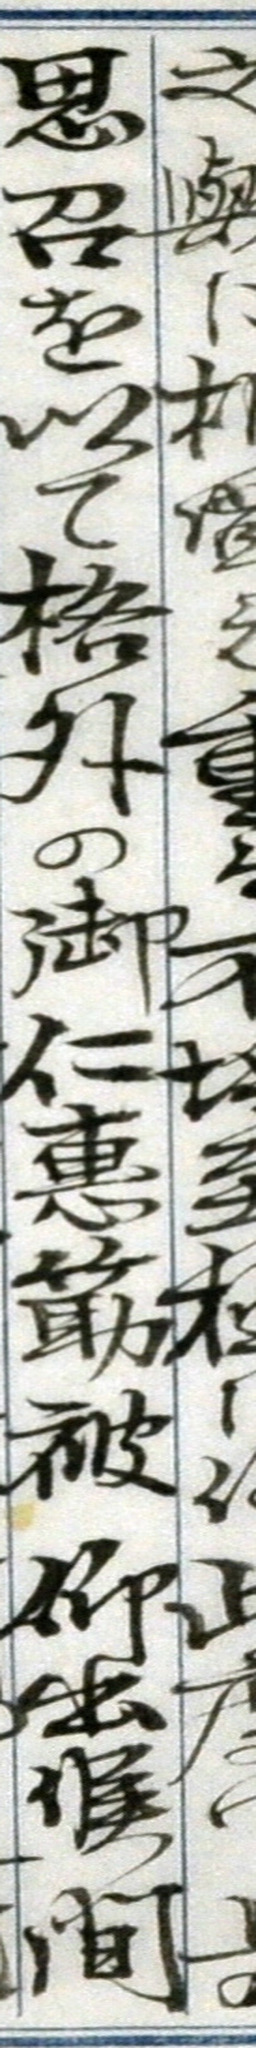思召を以て格外の御仁恵筋被仰出候間
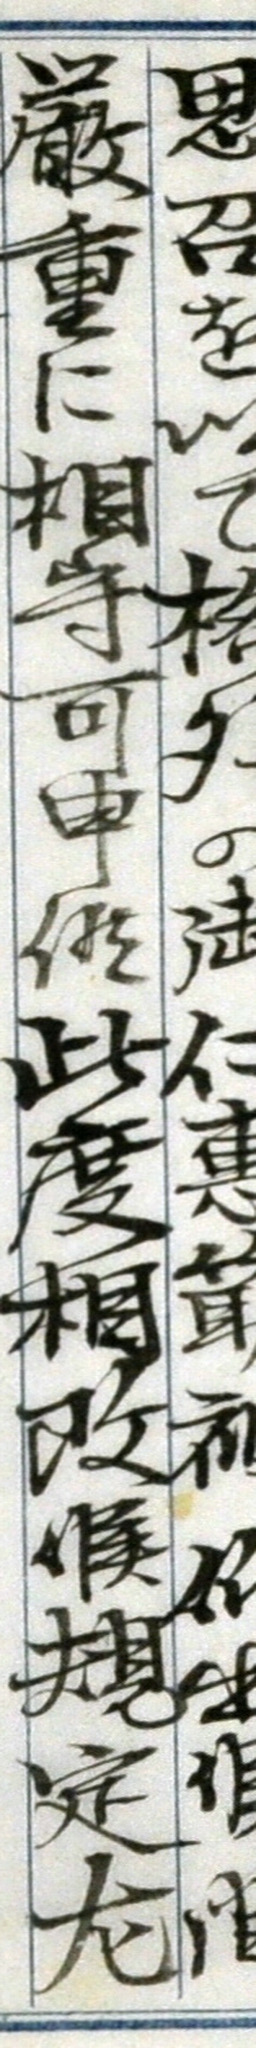厳重に相守可申候此度相改候規定左
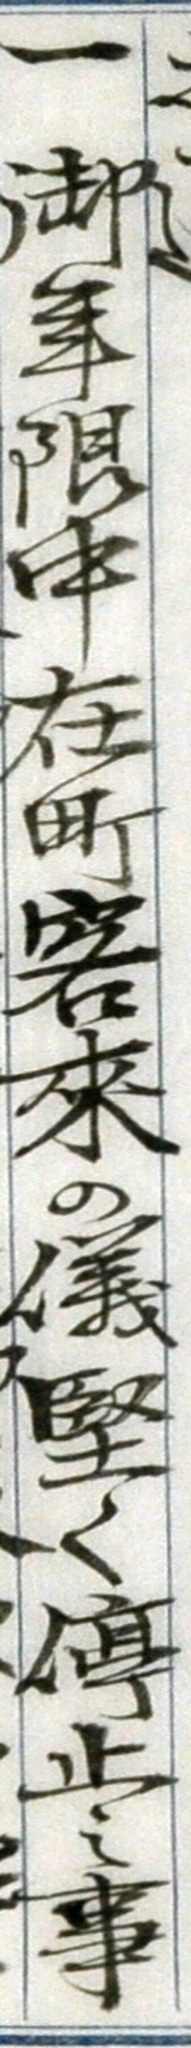一御年限中在町客来の儀堅く停止之事
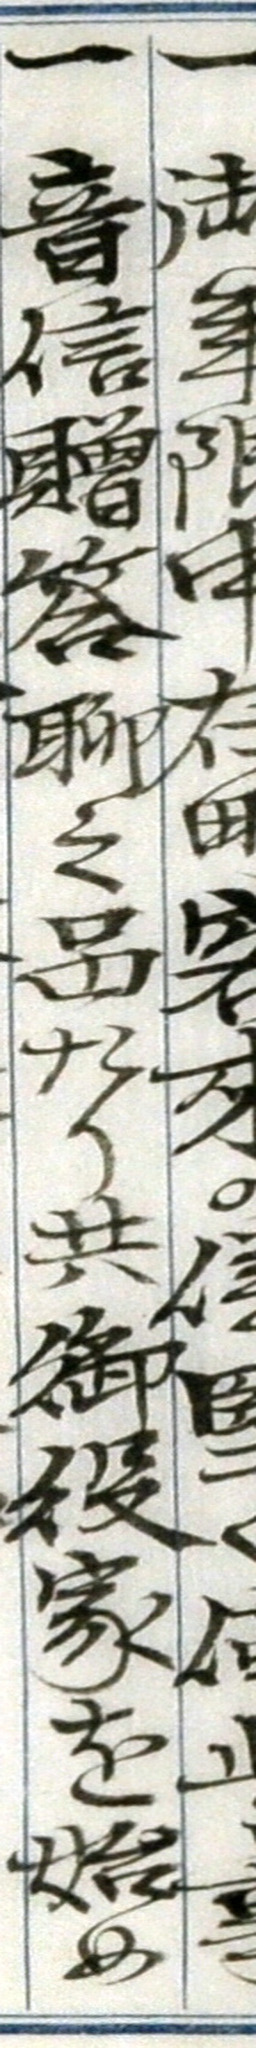一音信贈答聊之品たり共御役家を始め
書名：倹約筋御沙汰書
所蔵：伊那市立高遠町図書館・合同会社AMANE
